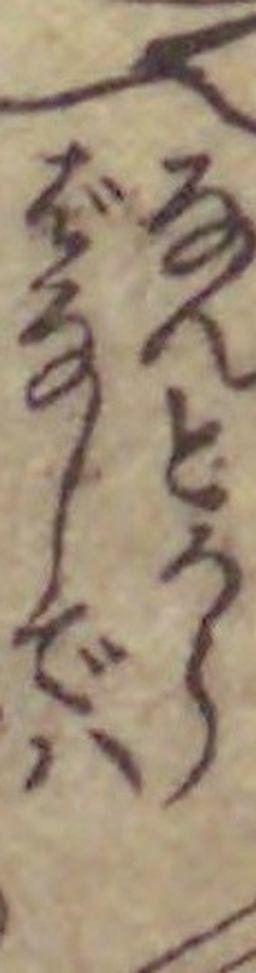ばなしでは
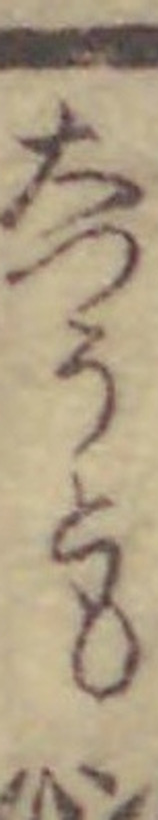大つうとも
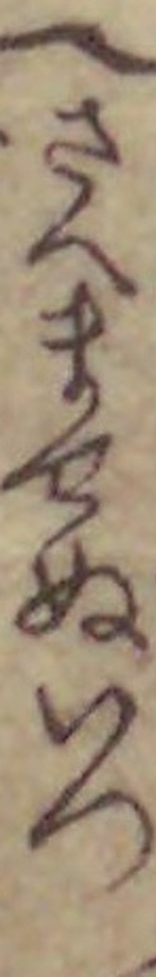さへませぬいつ
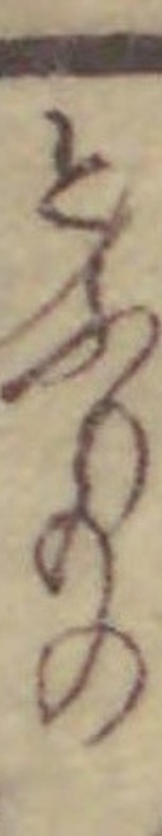とふりもの
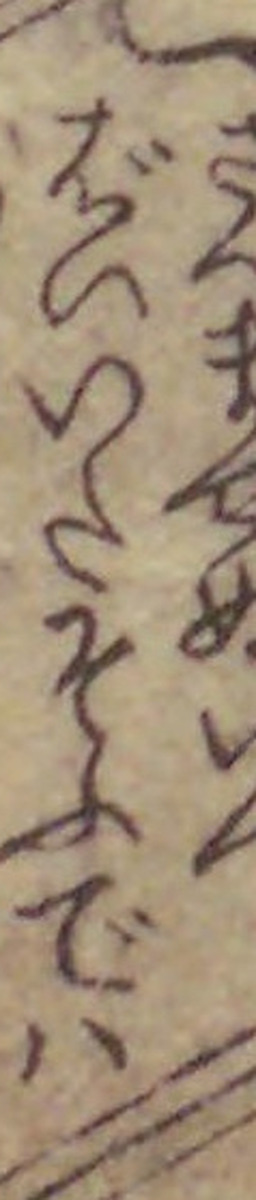ばいいたそふでは
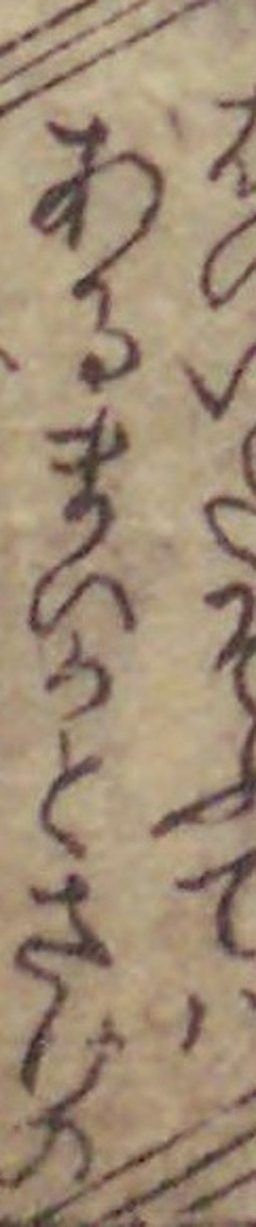あるまいかとさけの
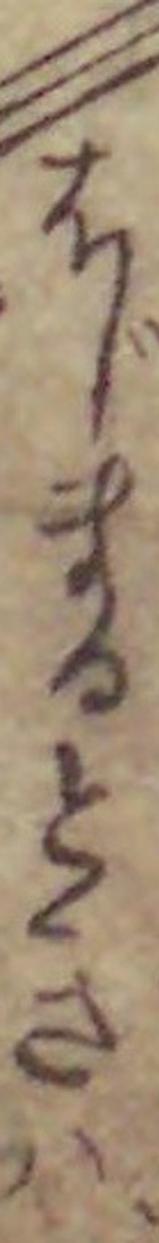はじまるときは
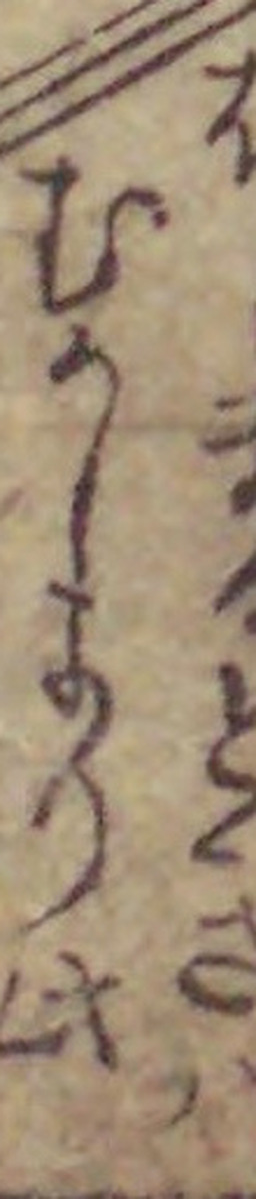むかしより此
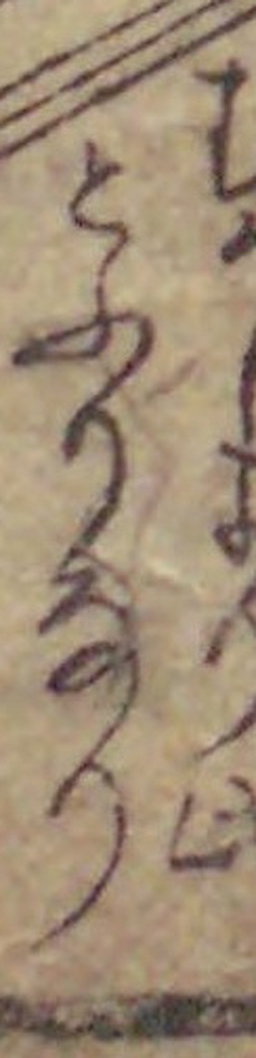とふりなり

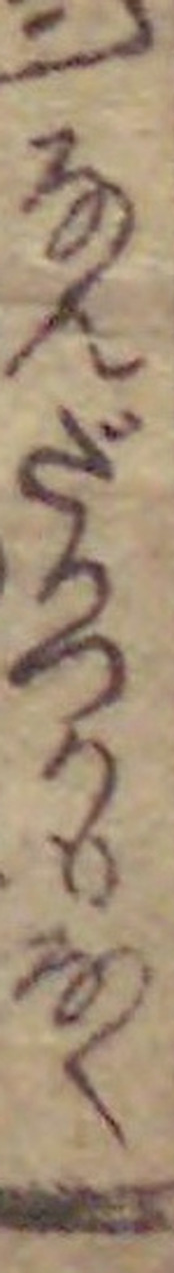なんだかつかもなく
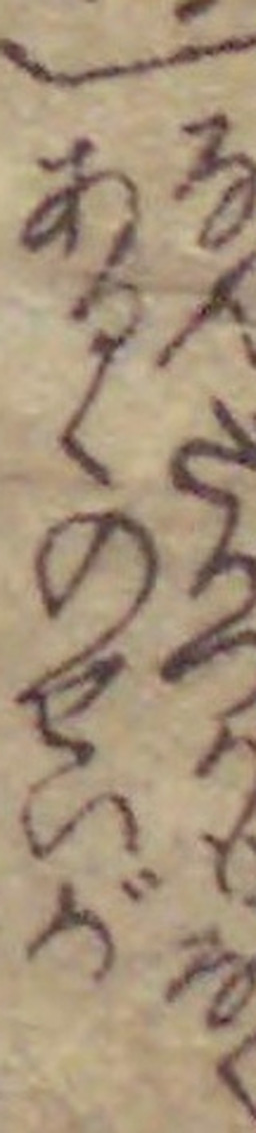あるくのせいが
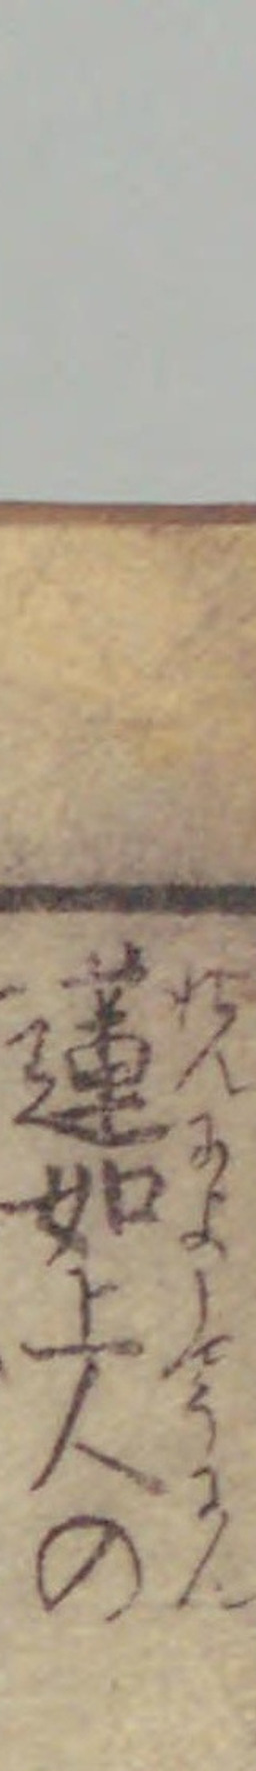蓮如上人の
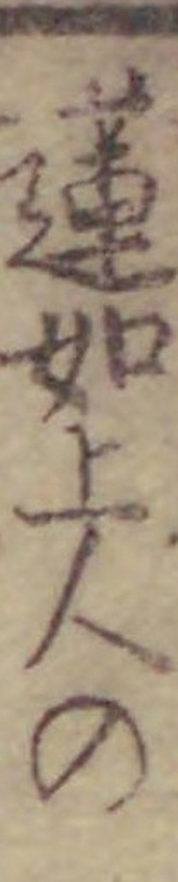蓮如上人の
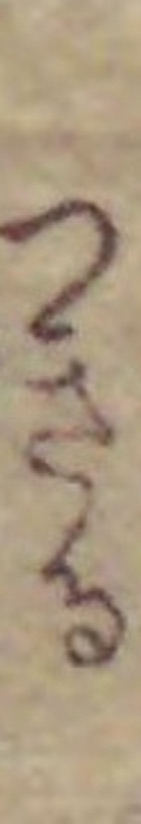つきる
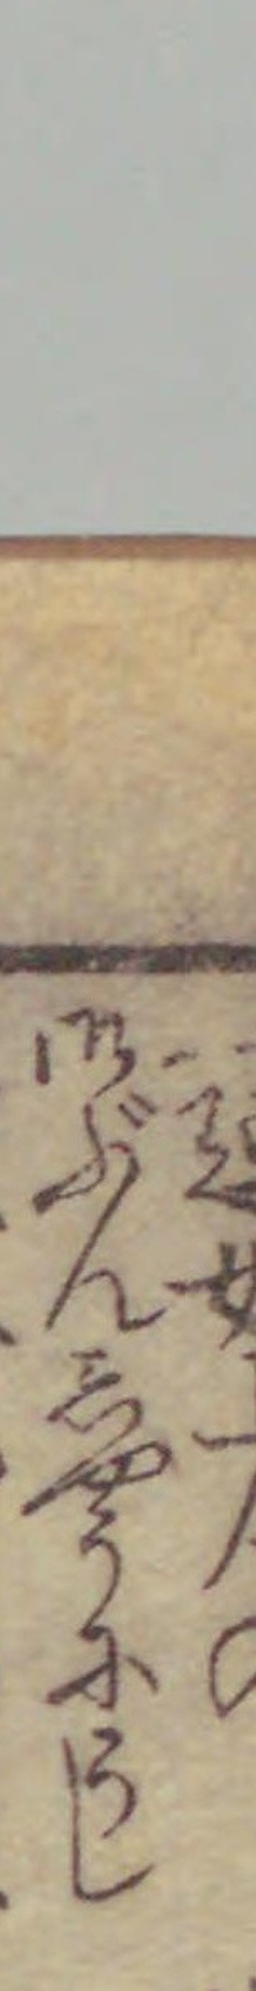御ぶんしやうにうし
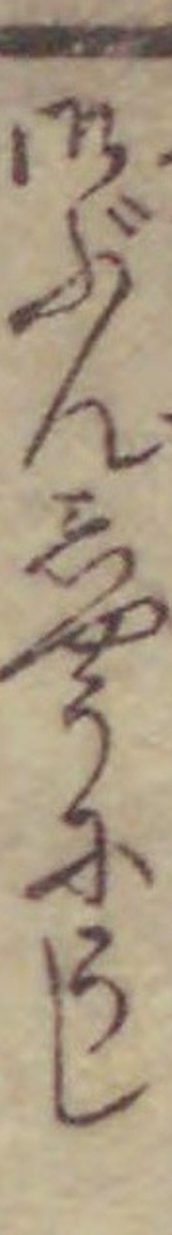御ぶんしやうにうし
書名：大通人穴[サガシ] 3巻
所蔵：国立国会図書館 National Diet Library, JAPAN
